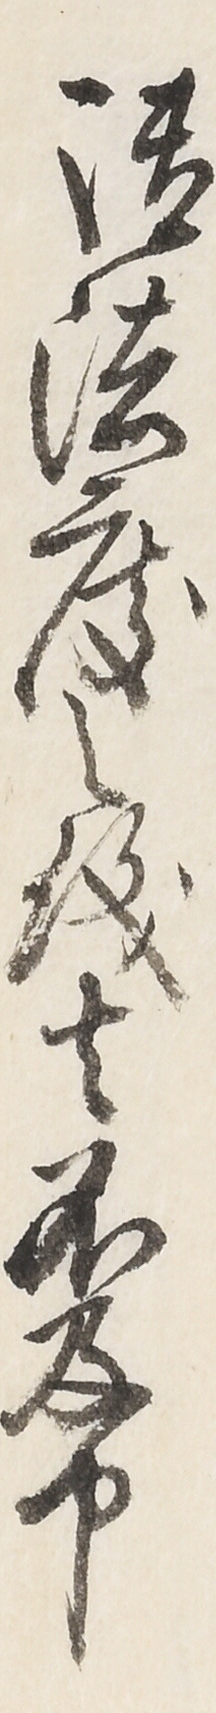御法度之儀者不及申
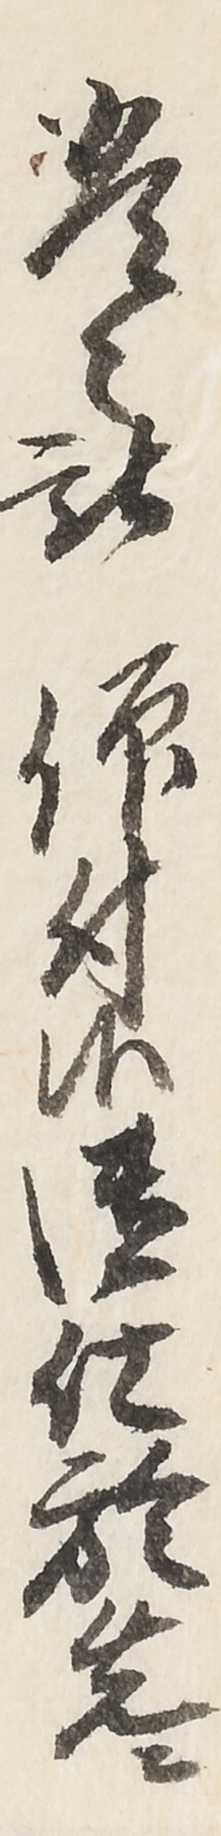常々被仰付候御仕於先ニ
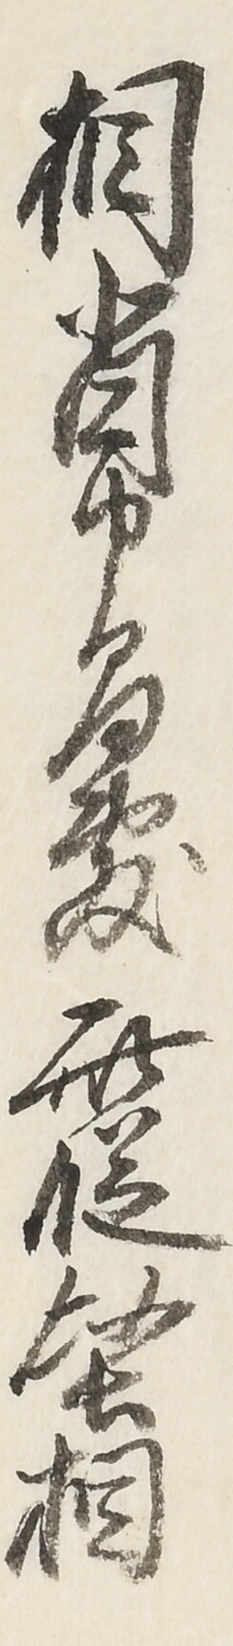相背申間敷此段堅相
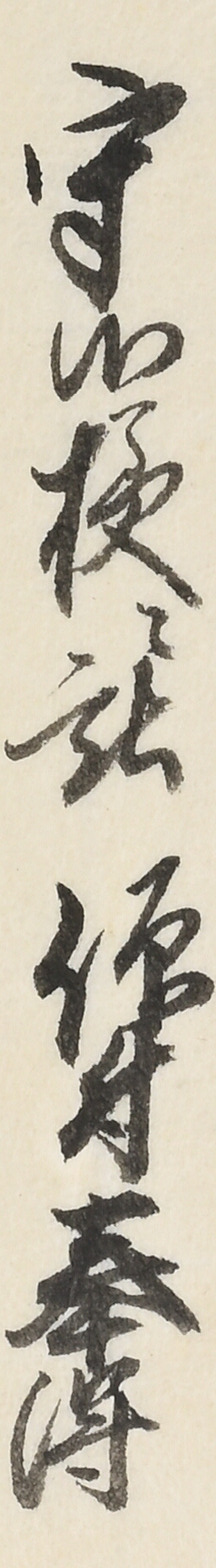守候様ニ被仰付奉得
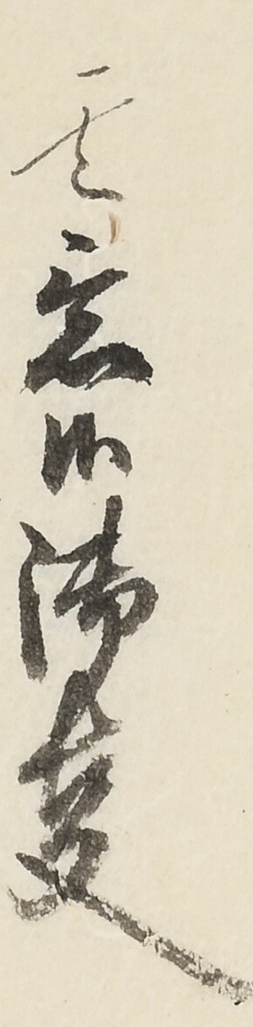其意候御事
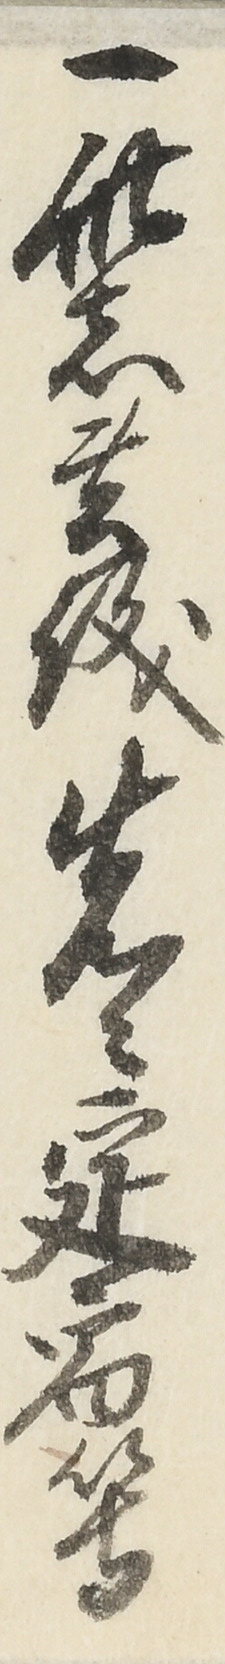一此者共儀先々定宿等
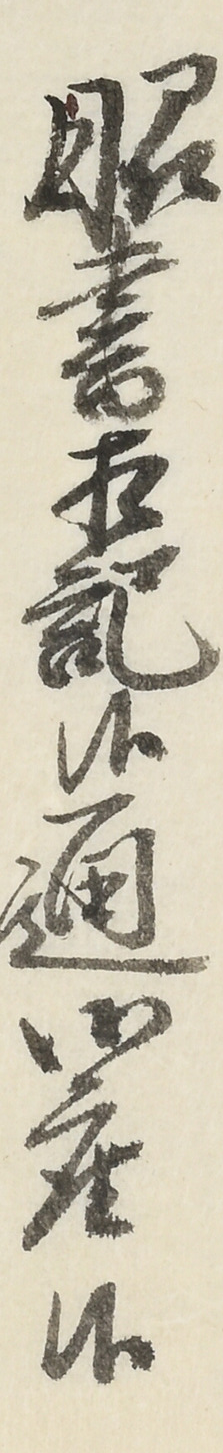脇書相記候通御座候
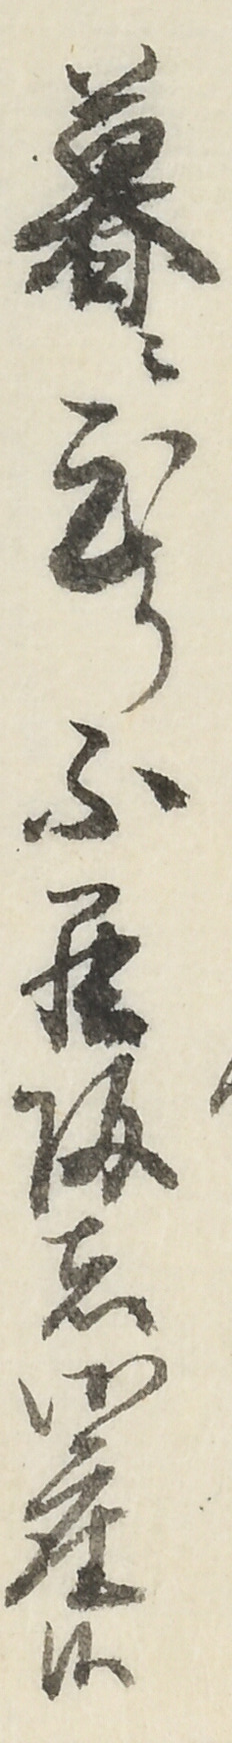暮ニ至り不罷帰者御座候
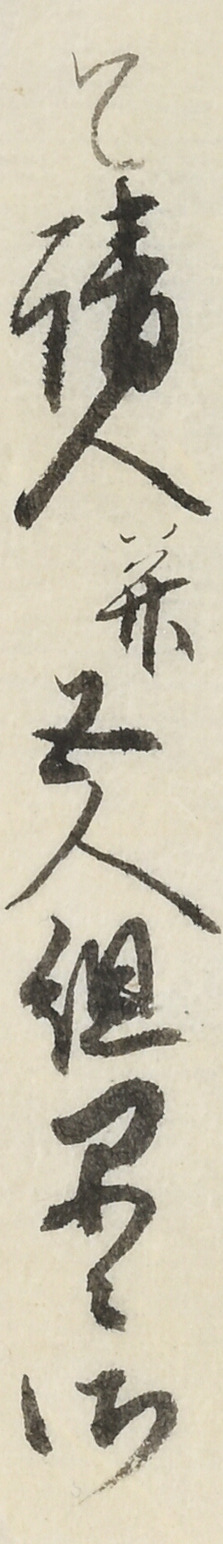ハヽ請人并五人組早々御

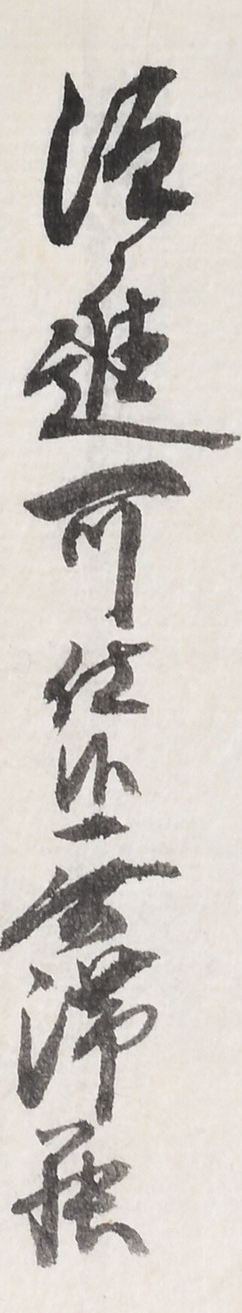注進可仕候無滞罷
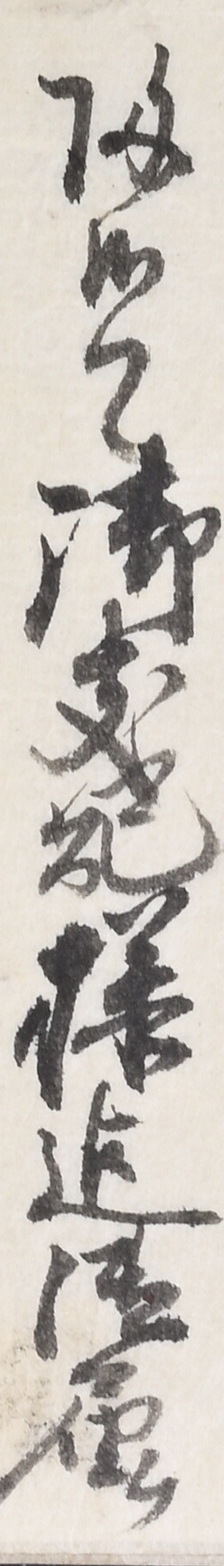帰候ハヽ御支配様迄御届ヶ
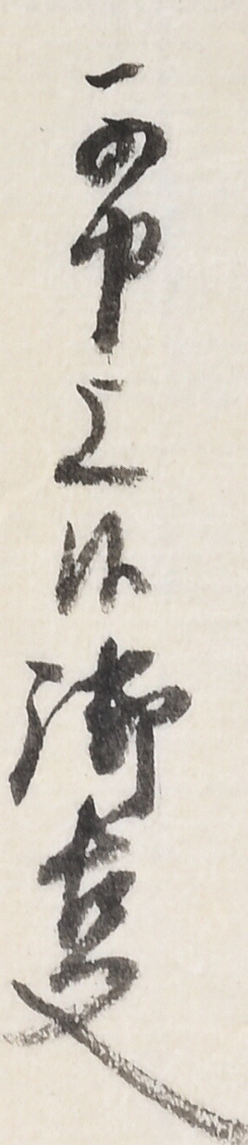可申上候御事
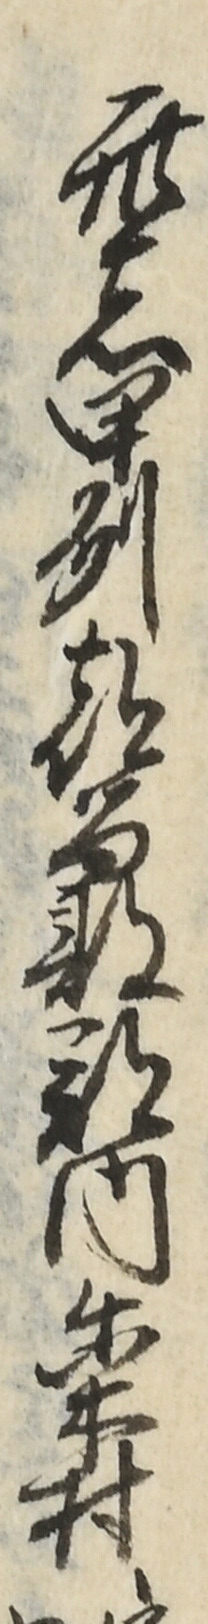此者甲州都留郡郡内真木村定宿
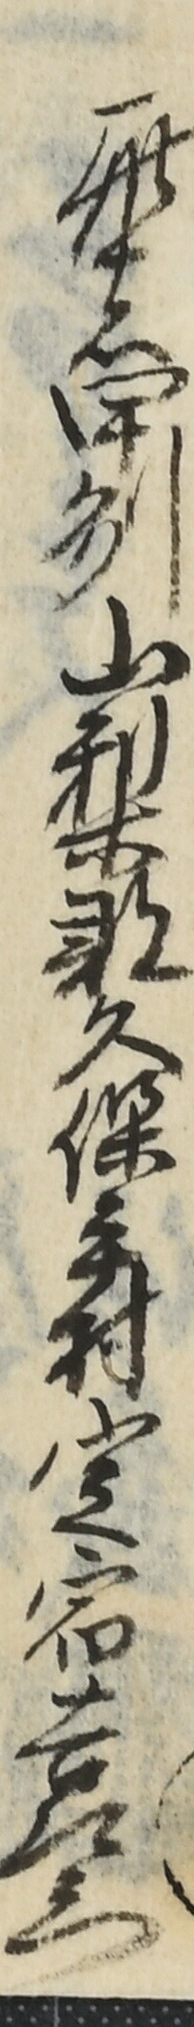此者甲州山梨郡久保平村定宿吉左衛門
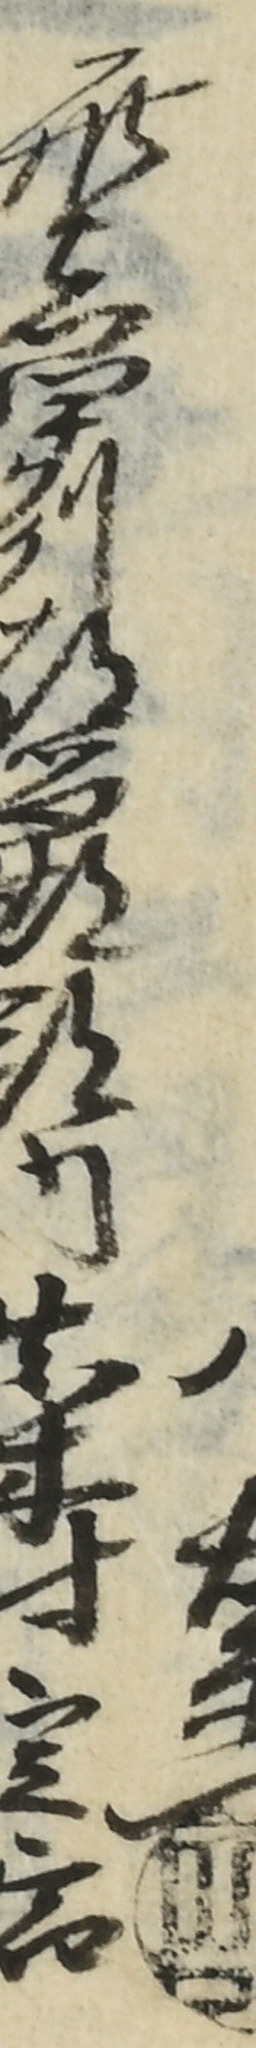此者甲州都留郡郡内真木村定宿

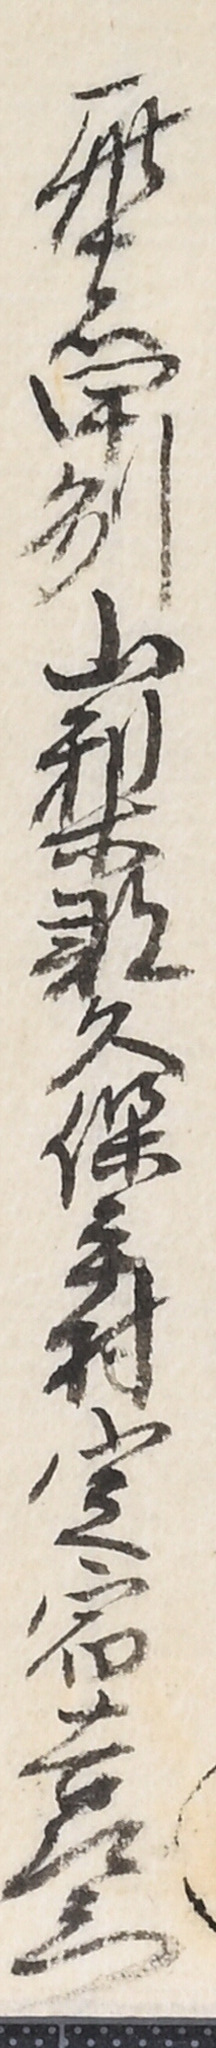此者甲州山梨郡久保平村定宿吉左衛門
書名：慶應二丙寅年二月他國出石切名前書上帳
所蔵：伊那市立高遠町図書館・合同会社AMANE
